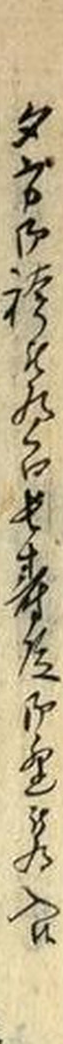夕方御袴被為召長寿殿御逢被為入候
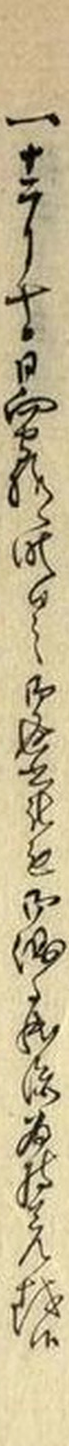一十二月十日日向守様へ昨日之御返書被進御側手紙添為持差越候
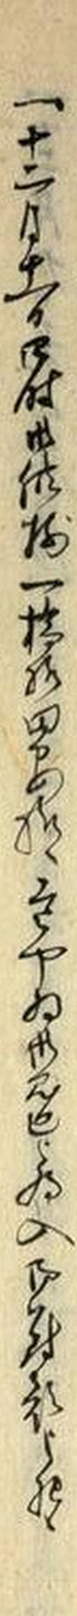一十二月十一日四時御供揃一橋様田安様へ寒中為御見廻被為入御対顔被遊候
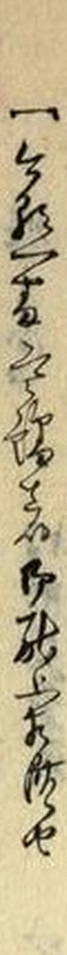一今朝一番寒鱈着御献上相済候由
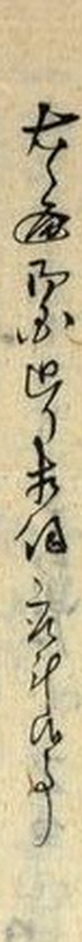右之通御国廻り相伺取斗候事
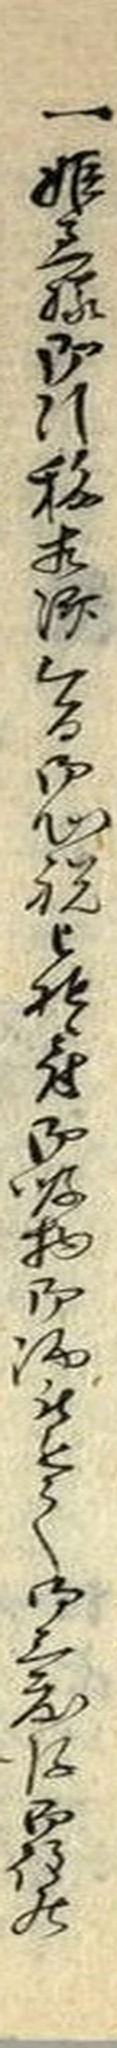一姫君様御引移相済今日御心祝被遊候ニ付御吸物御酒被進之御三度後御住居
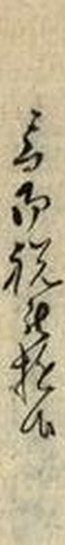ニ而御祝被遊候
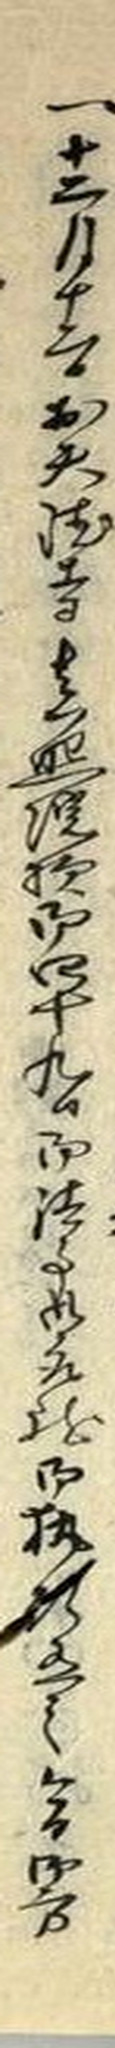一十二月十二日於天徳寺真照院様御四十九日御法事御取越御執行有之今日御方
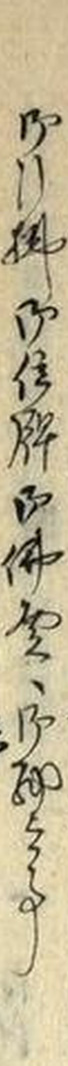御引払御位牌御仏殿へ御納候事
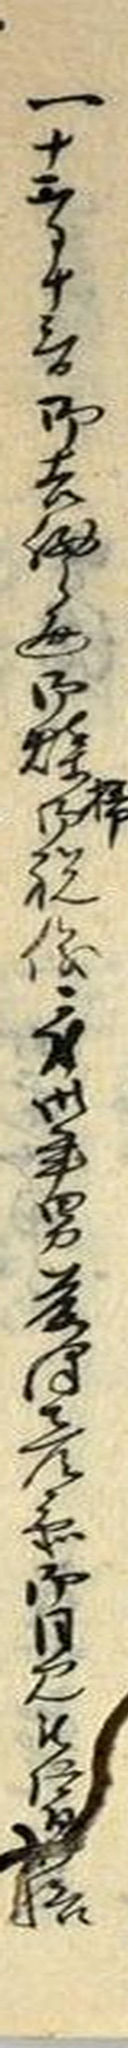一十二月十三日御吉例之通御煤掃祝儀ニ付御年男藤沢彦兵衛御目見被仰付御膳
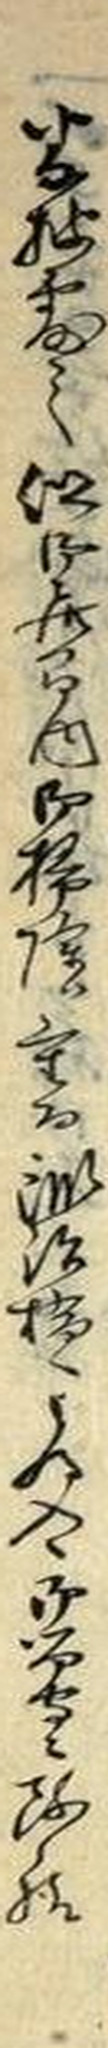番披露之但御居間内御掃除ハ重而鍛冶橋へ被為入候御留守ニ致候様

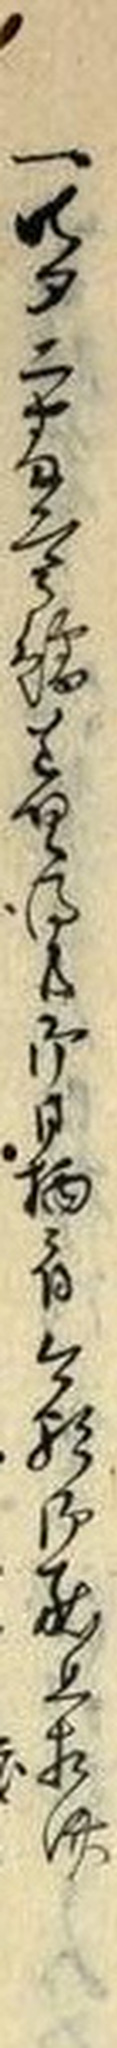一昨夕二番寒鱈着候得共御日柄ニ付今朝御献上相済
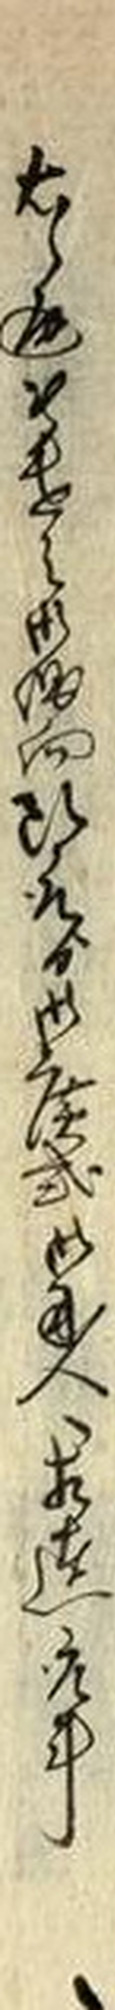右之通被遣候御側向頭取ゟ御広式御用人へ相達取斗
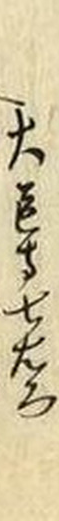大道寺七右衛門
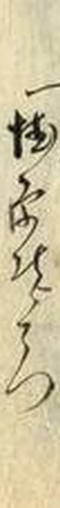埴原次郎右衛門
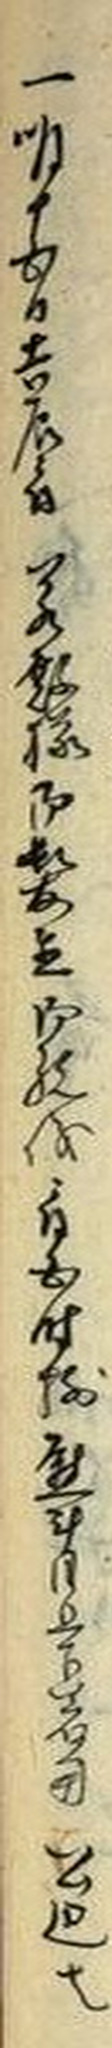一明十五日吉辰ニ付若殿様御髪置御祝儀ニ付五時揃熨斗目上下着用公辺者
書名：少傅日録抄（斉承付側向頭取日記、在府）
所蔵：福井県文書館 Fukui Prefectural Archives
